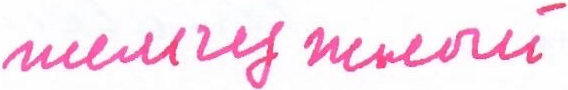жемчужный
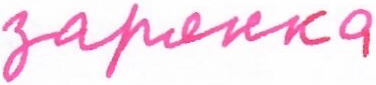зарянка
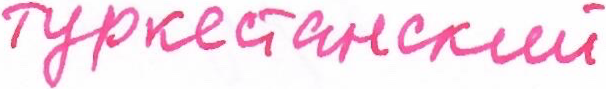туркестанский
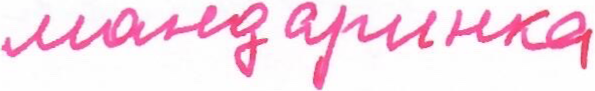мандаринка
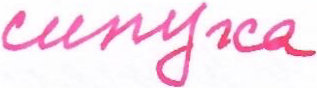сипуха
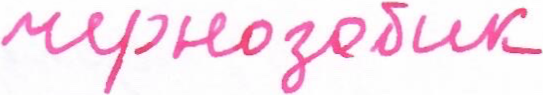чернозобик
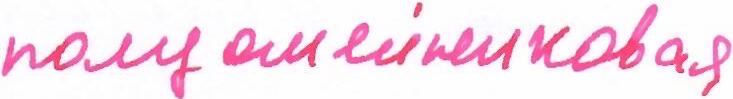полуошейниковая
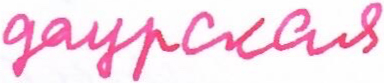даурская
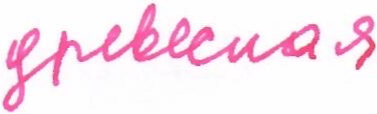древесная
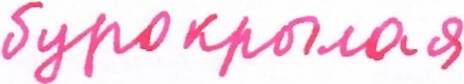бурокрылая
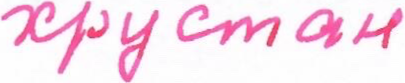хрустан
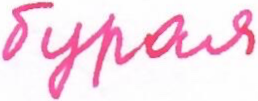бурая
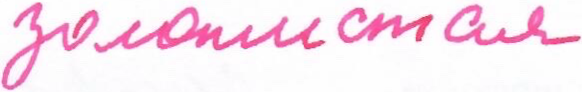золотистая
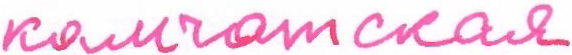камчатская
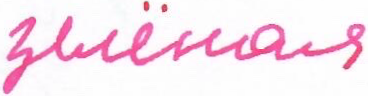зелёная
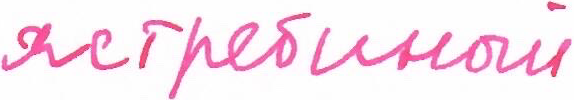ястребиный
